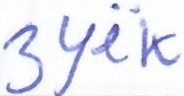зуёк
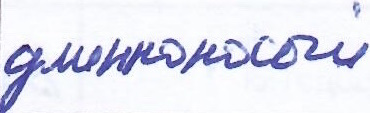длинноносый
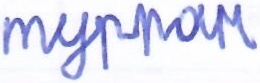турпан
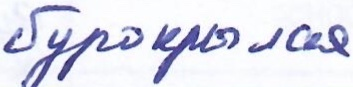бурокрылая
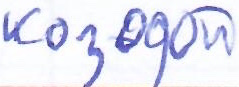козодой
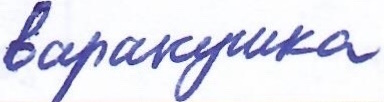варакушка
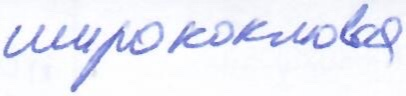ширококлювая
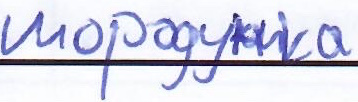мородунка
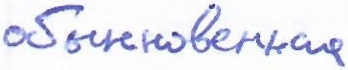обыкновенная
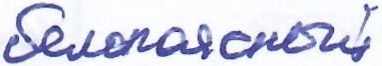белопоясный
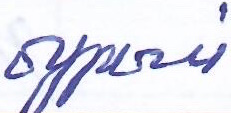бурый
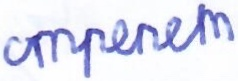стрепет
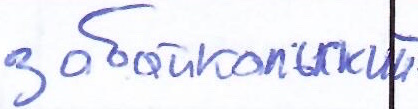забойкольский
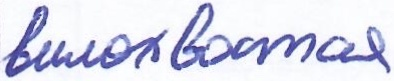вилохвостая
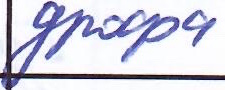дрофа
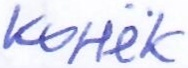конёк
